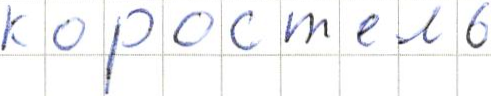коростель
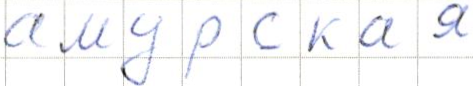амурская
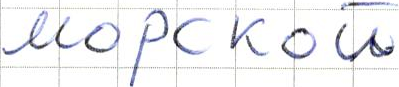морской
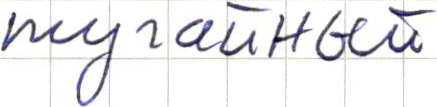тугайный
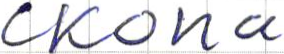скопа
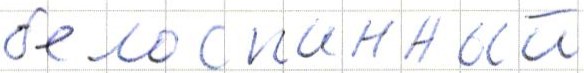белоспинный
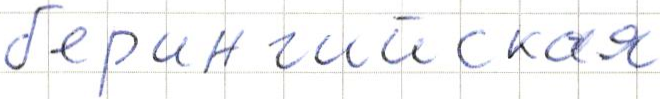берингийская
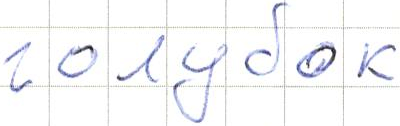голубок
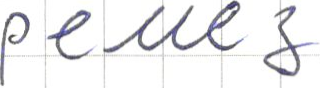ремез
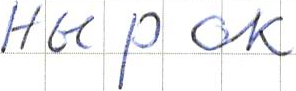нырок
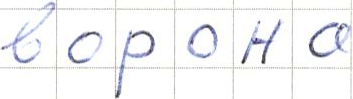ворона
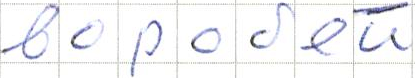воробей
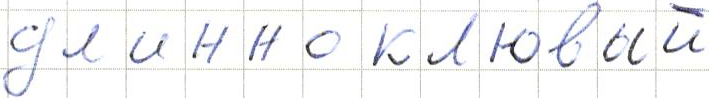длинноклювый
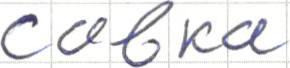савка
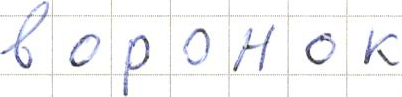воронок
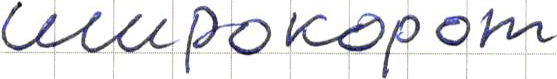широкорот
